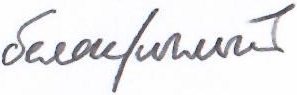белокрылый
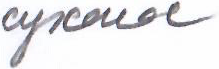сухонос
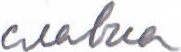славка
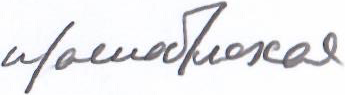краснобрюхая
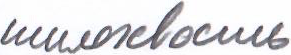шилохвость
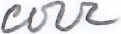сыч
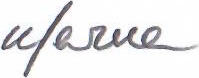крачка
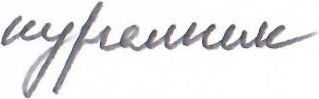курганник
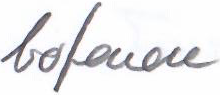воронок
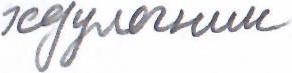ходулочник
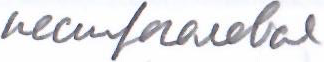пестроголовая
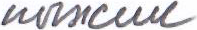пыжик
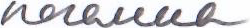поганка
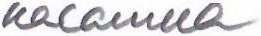касатка
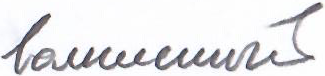волнистый
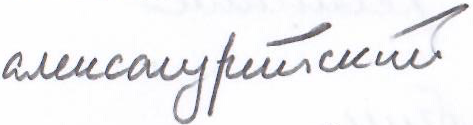александрийский
